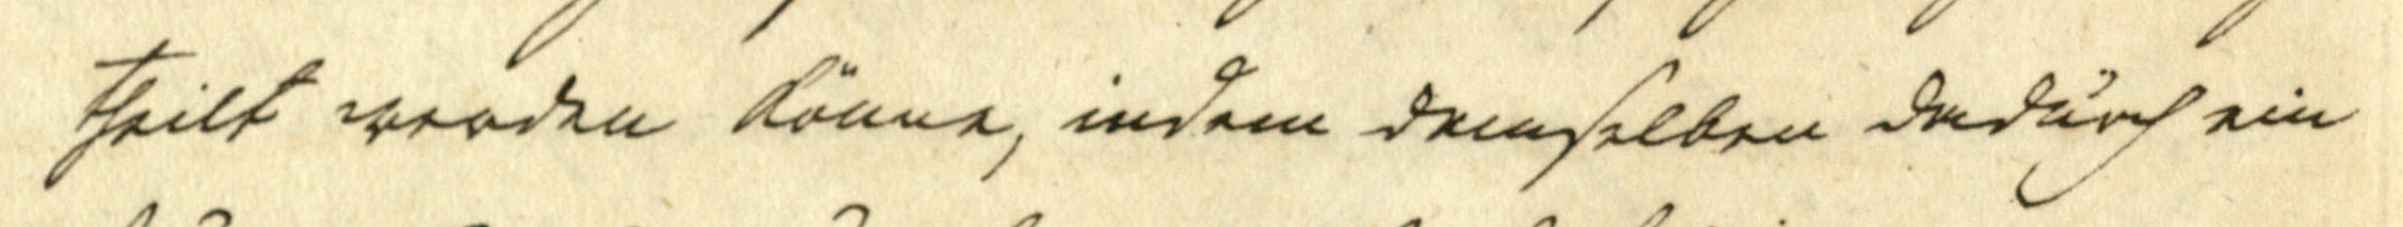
theilt werden könne, indem demselben dadurch ein
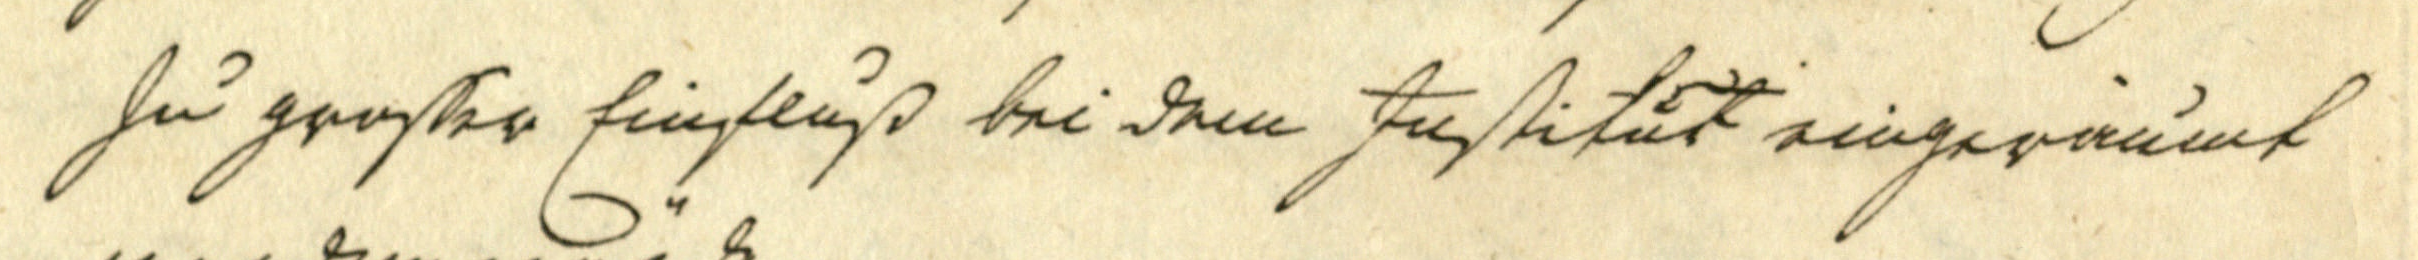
zu grosser Einfluß bei dem Institut eingeräumt
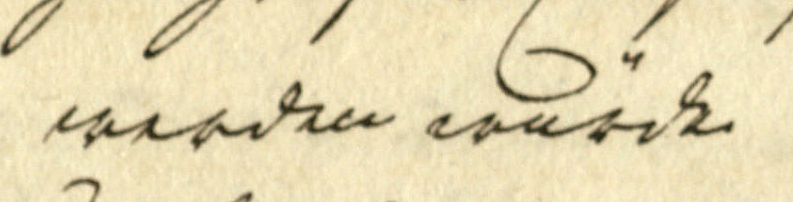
werden würde.
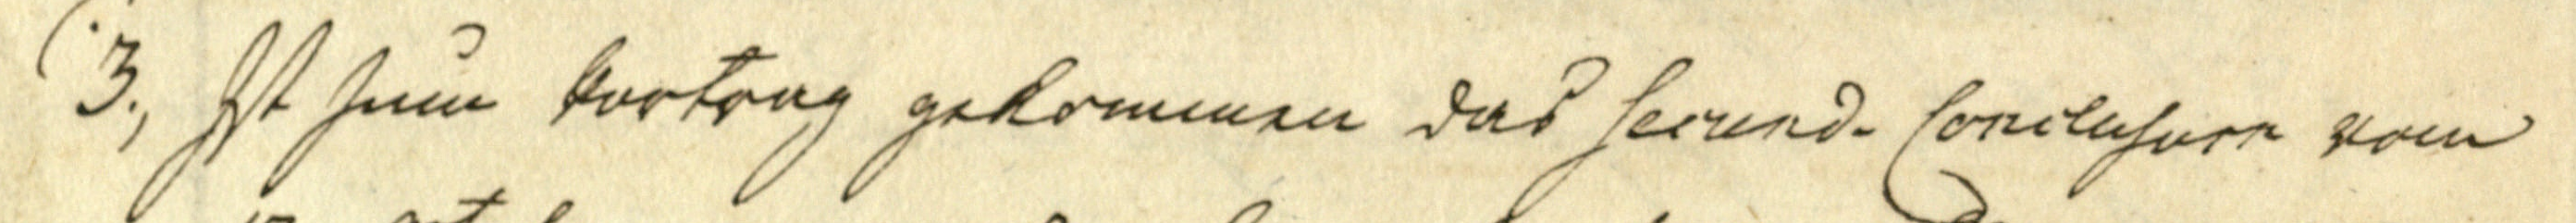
3., Ist zum Vortrag gekommen das secund. Conclusum vom
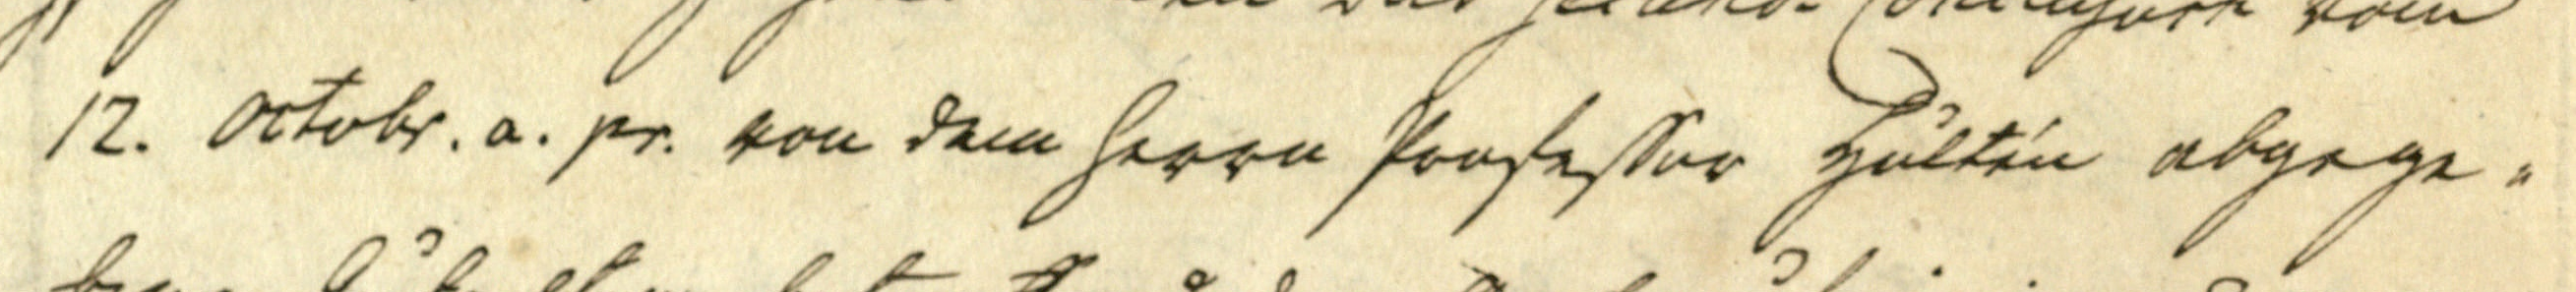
12. Octobr. a. pr. von dem Herrn Professor Hultén abgege¬
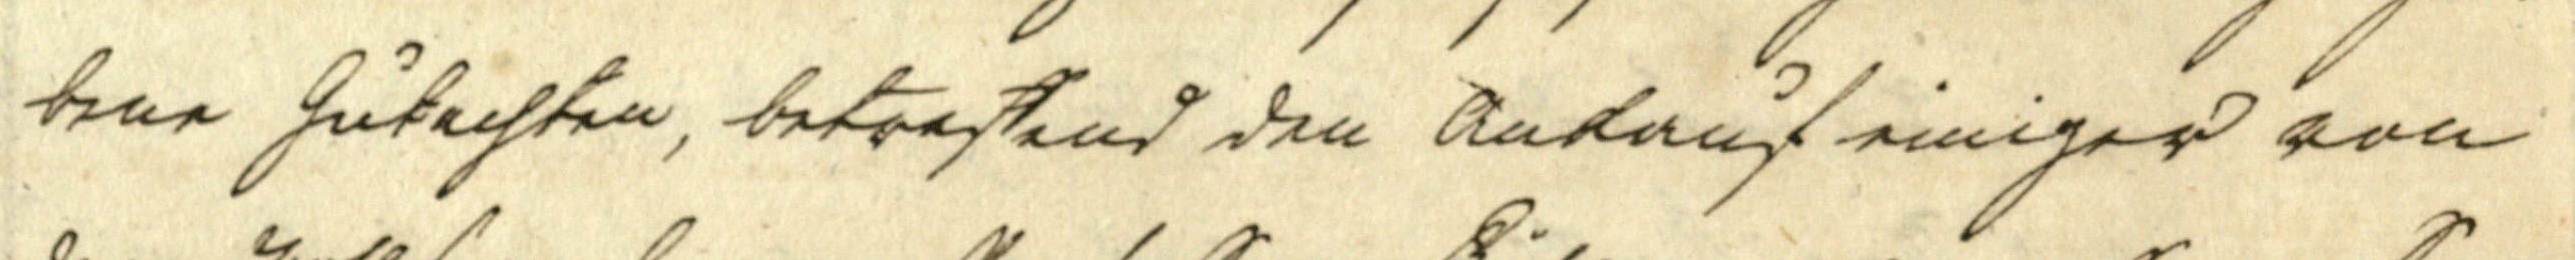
bene Gutachten, betreffend den Ankauf einiger von
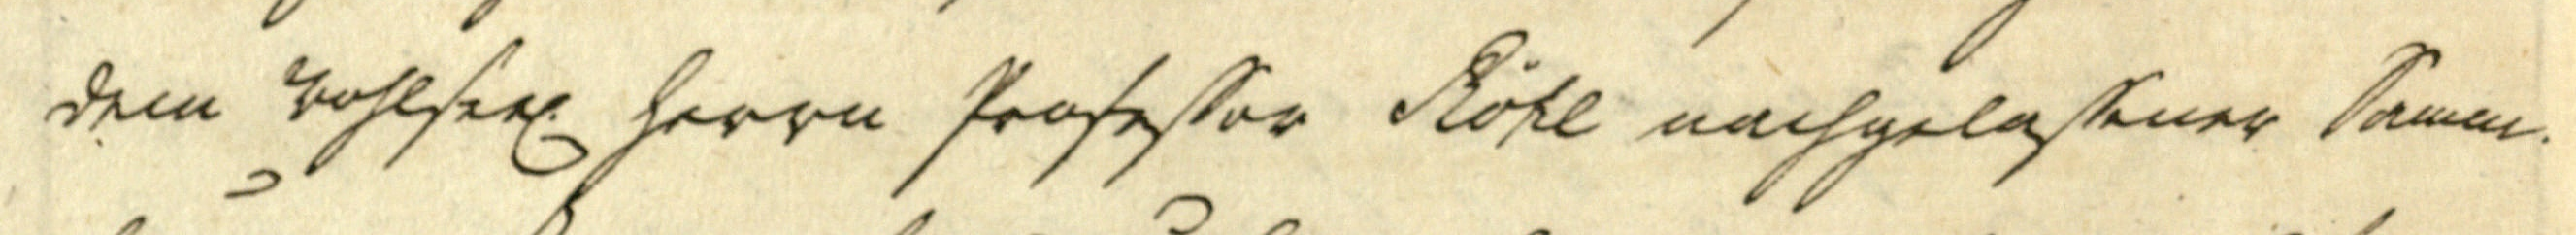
dem Wohlseel. Herrn Professor Röhl nachgelassener Samm¬
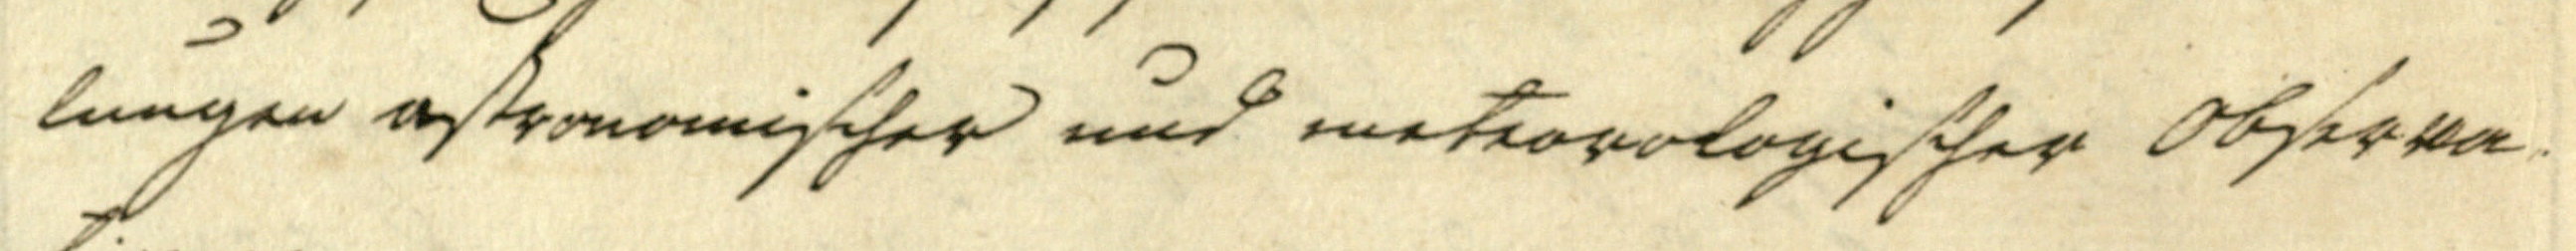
lungen astronomischer und meteorologischer Observa¬
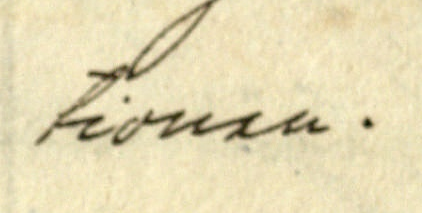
tionen.
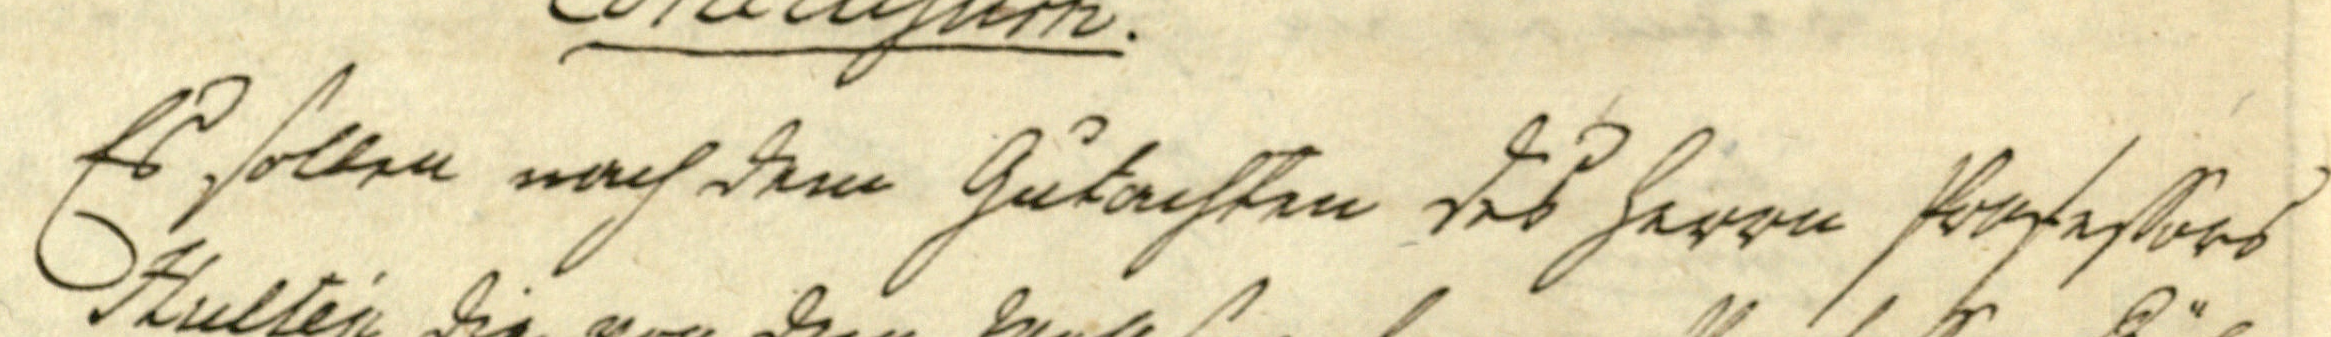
Es sollen nach dem Gutachten des Herrn Professors
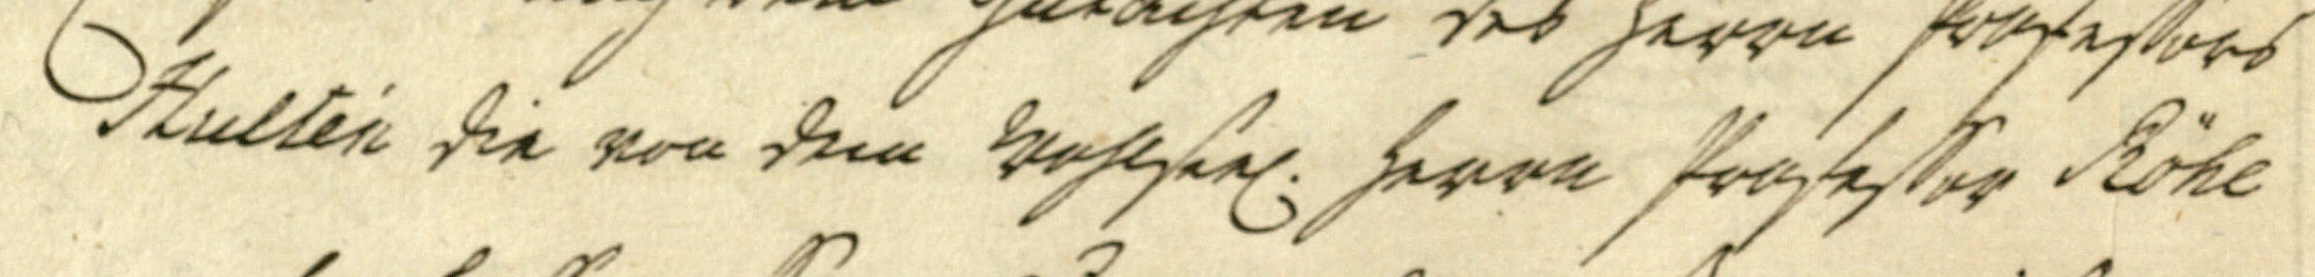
Hultén die von dem Wohlseel. Herrn Professor Röhl
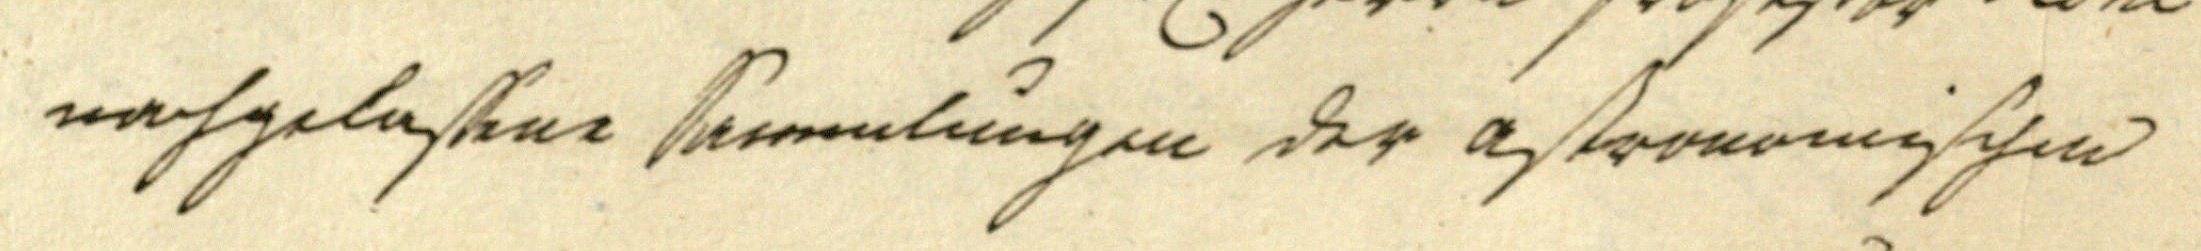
nachgelassene Sammlungen der astronomischen
